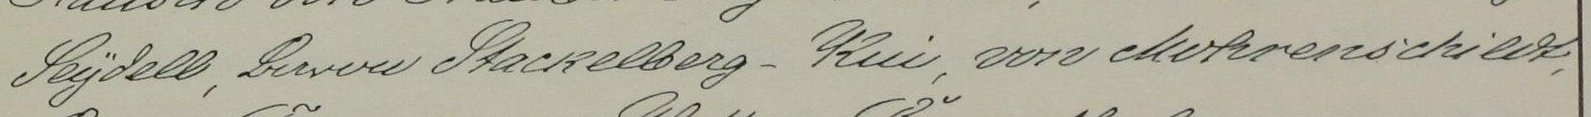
Seydell, Baron Stackelberg-Kui, von Mohrenschildt,
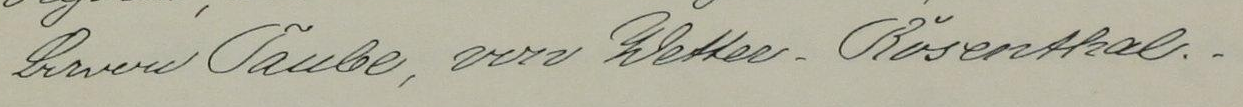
Baron Taube, von Wetter-Rosenthal.
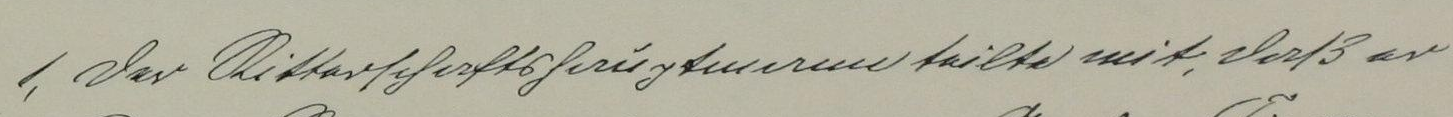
1. Der Ritterschaftshauptmann teilte mit, daß er
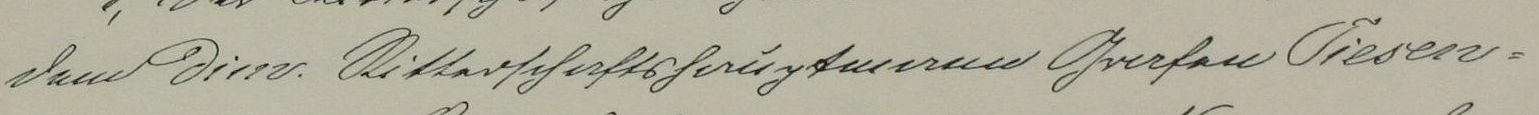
dem dim. Ritterschaftshauptmann Grafen Tiesen-
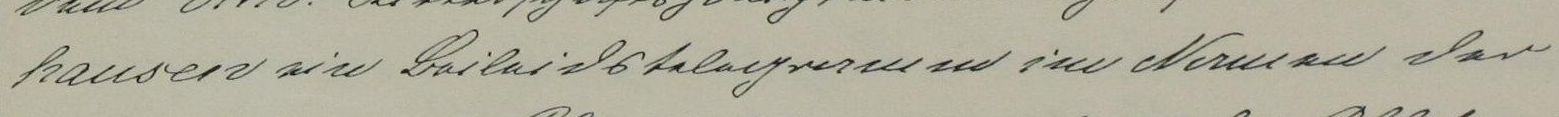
hausen ein Beileidstelegramm im Namen der
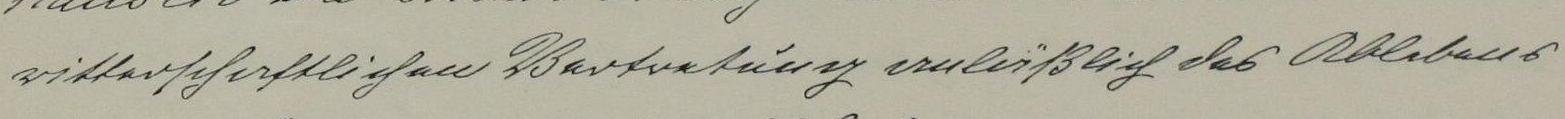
ritterschaftlichen Vertretung anläßlich des Ablebens
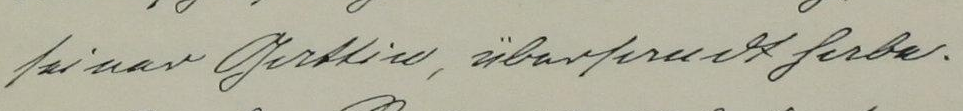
seiner Gattin, übersandt habe.
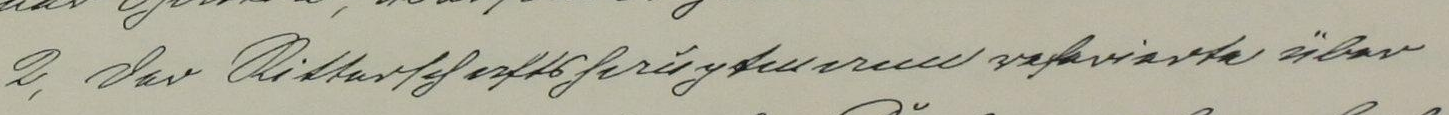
2. Der Ritterschaftshauptmann referierte über
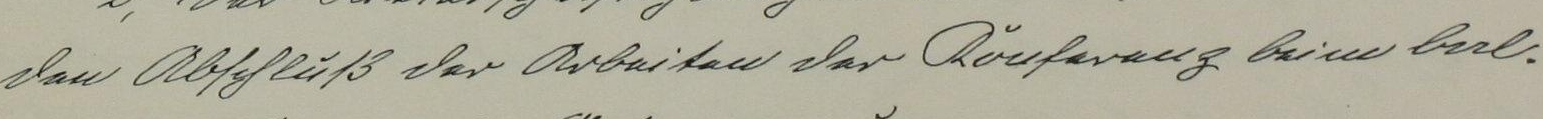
den Abschluß der Arbeiten der Konferenz beim bal-
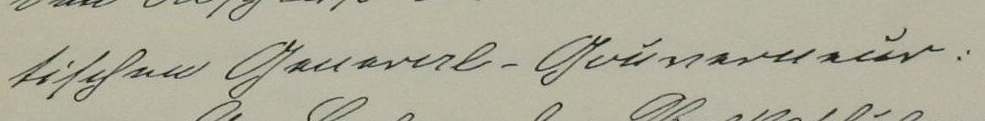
tischen General-Gouverneur:
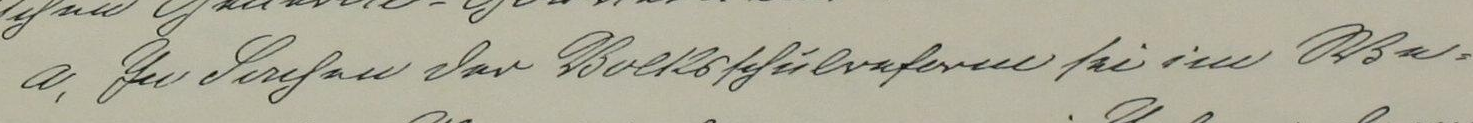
a. In Sachen der Volksschulreform sei im We-
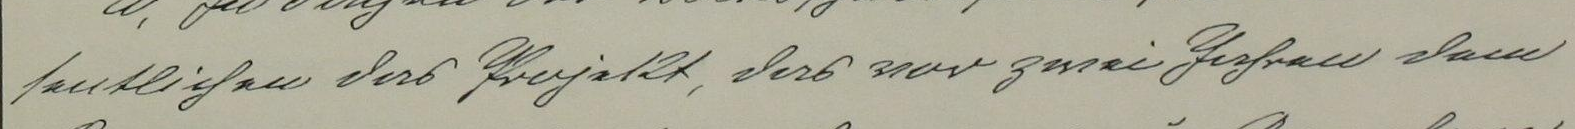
sentlichen das Projekt, das vor zwei Jahren dem
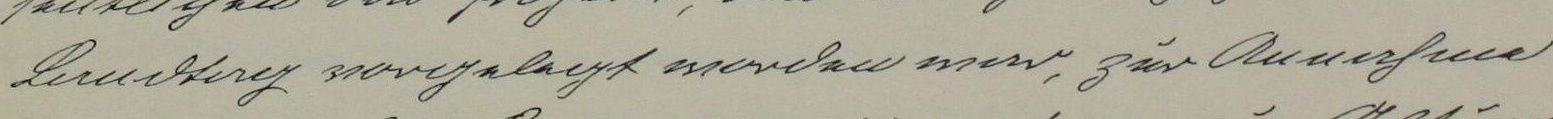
Landtag vorgelegt worden war, zur Annahme
